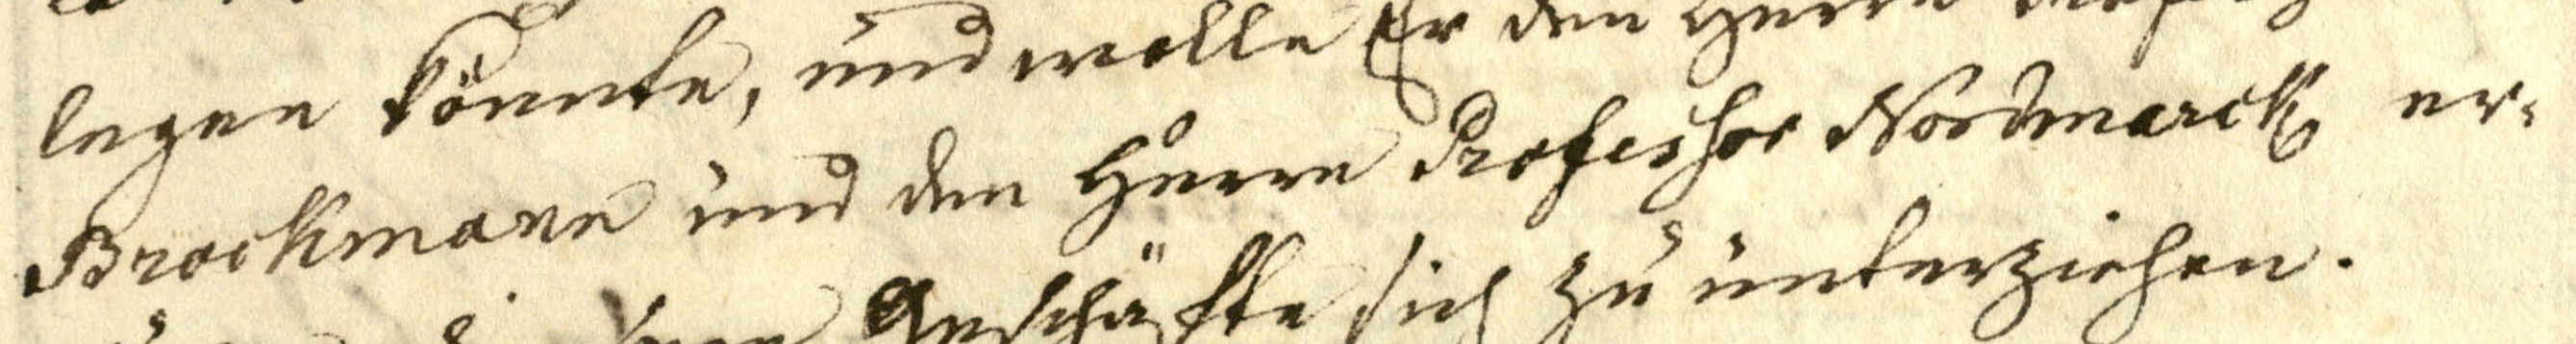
Brockmann und dem Herrn Professor Nordmarck, er¬
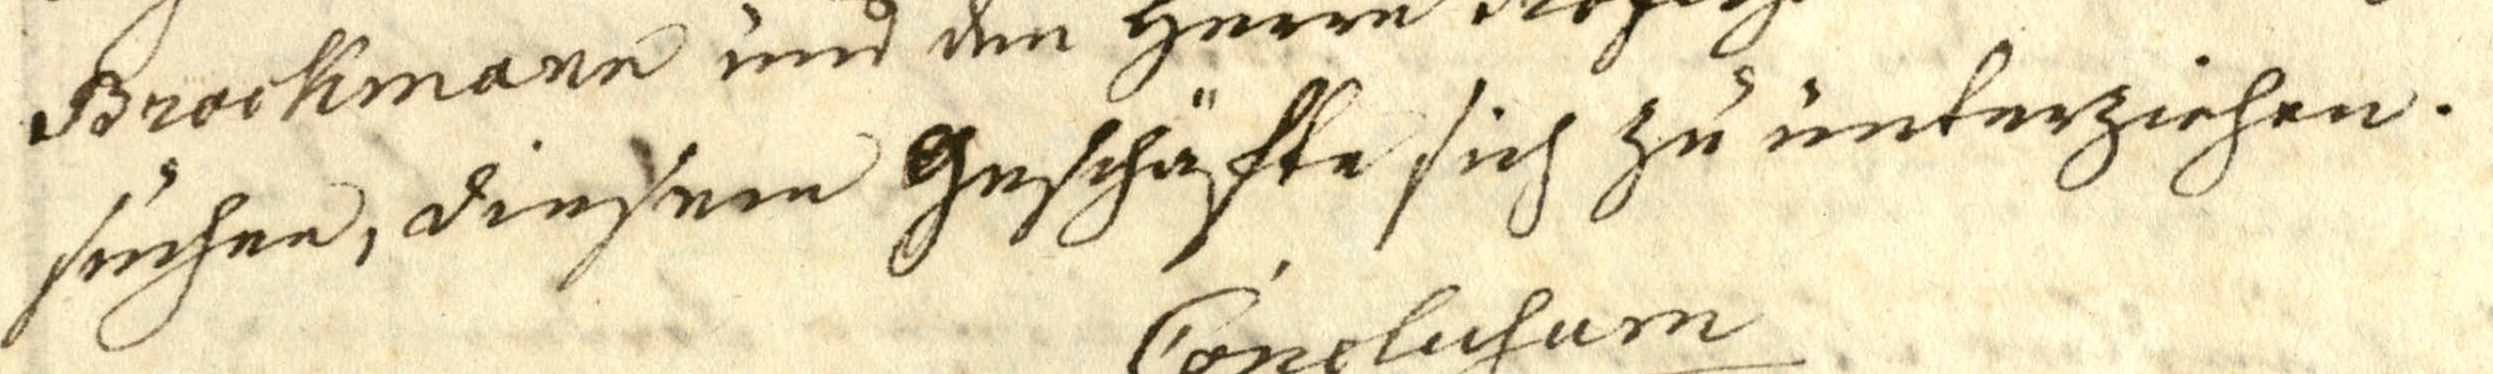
suchen, diesem Geschäfte sich zu unterziehen.
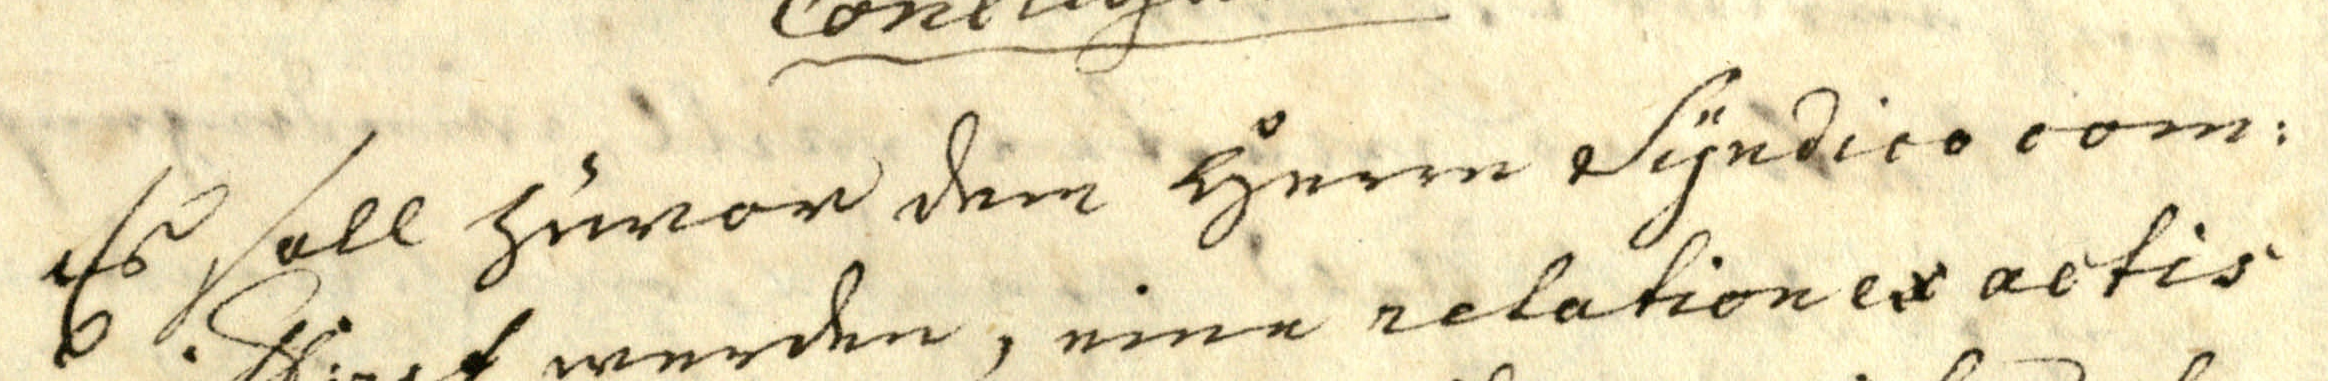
Es soll zuvor dem Herrn Sÿndico com¬
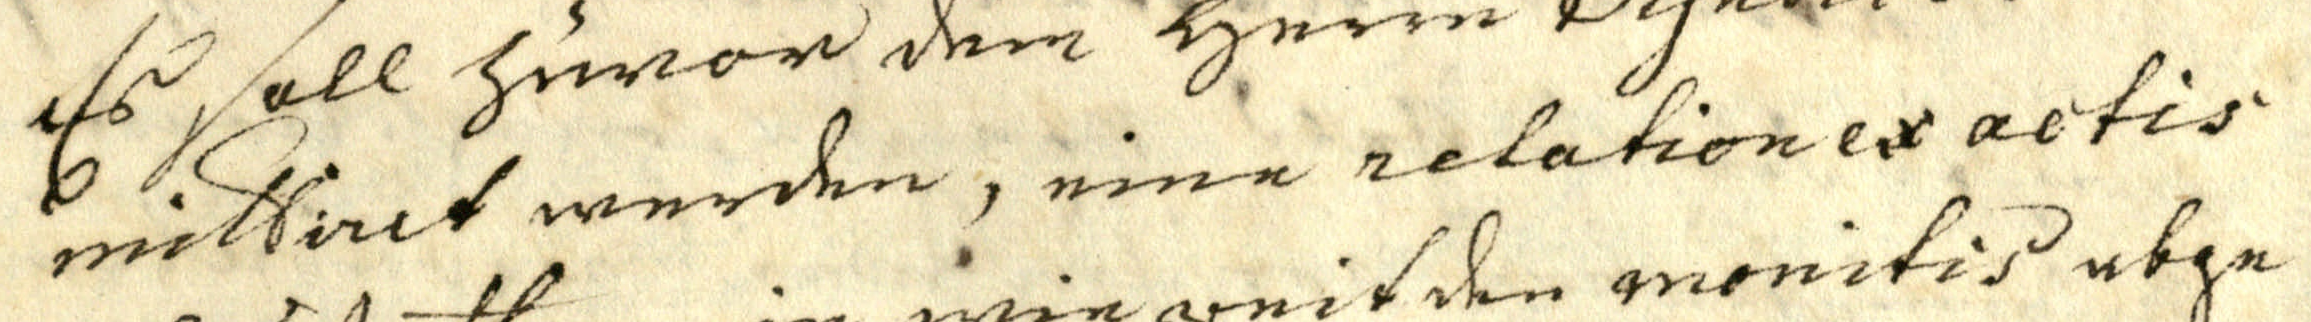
mittiret werden, eine relation ex Actis
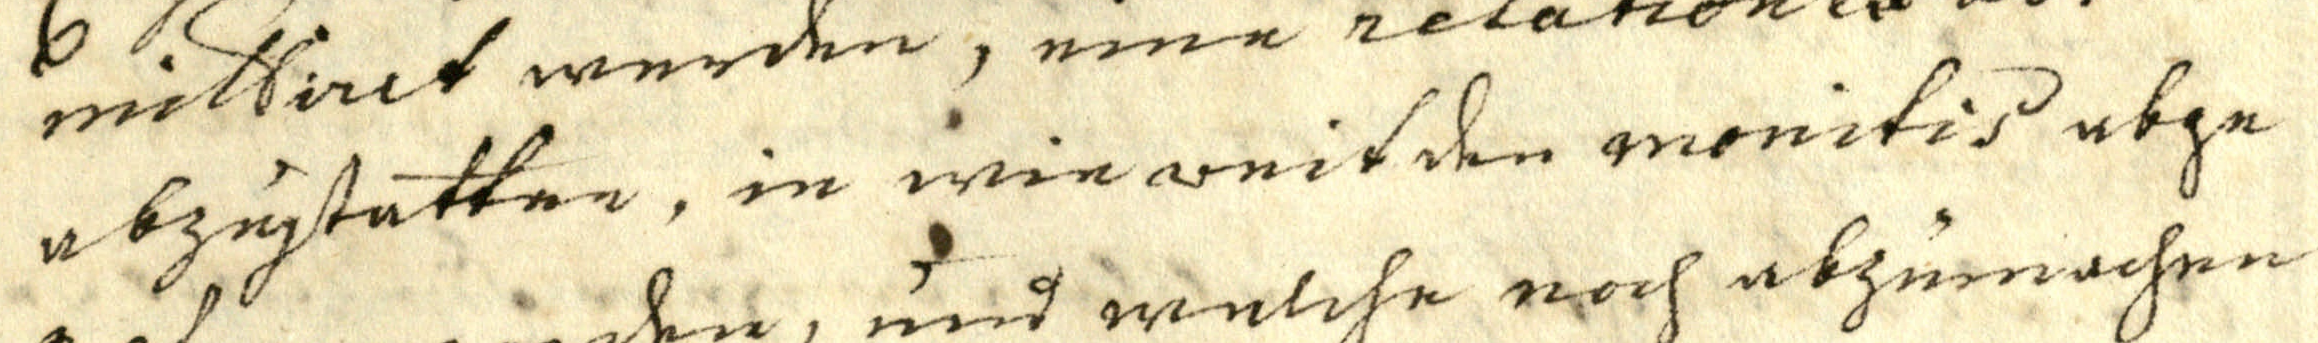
abzustatten, in wie weit den monitis abge¬
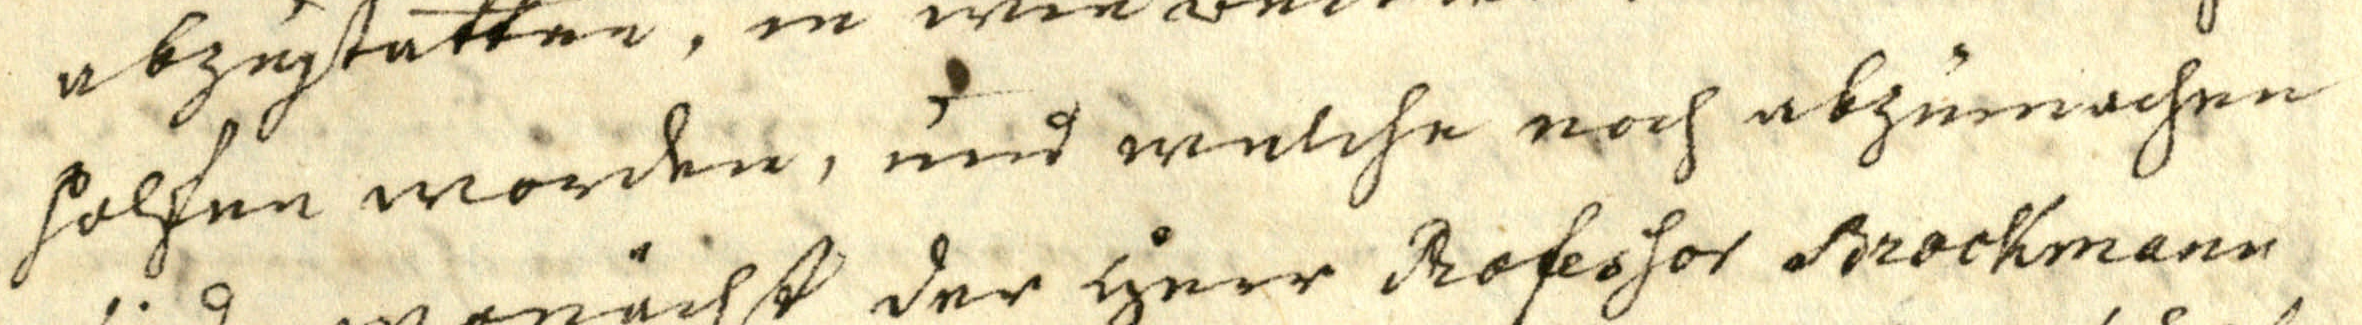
holfen worden, und welche noch abzumachen
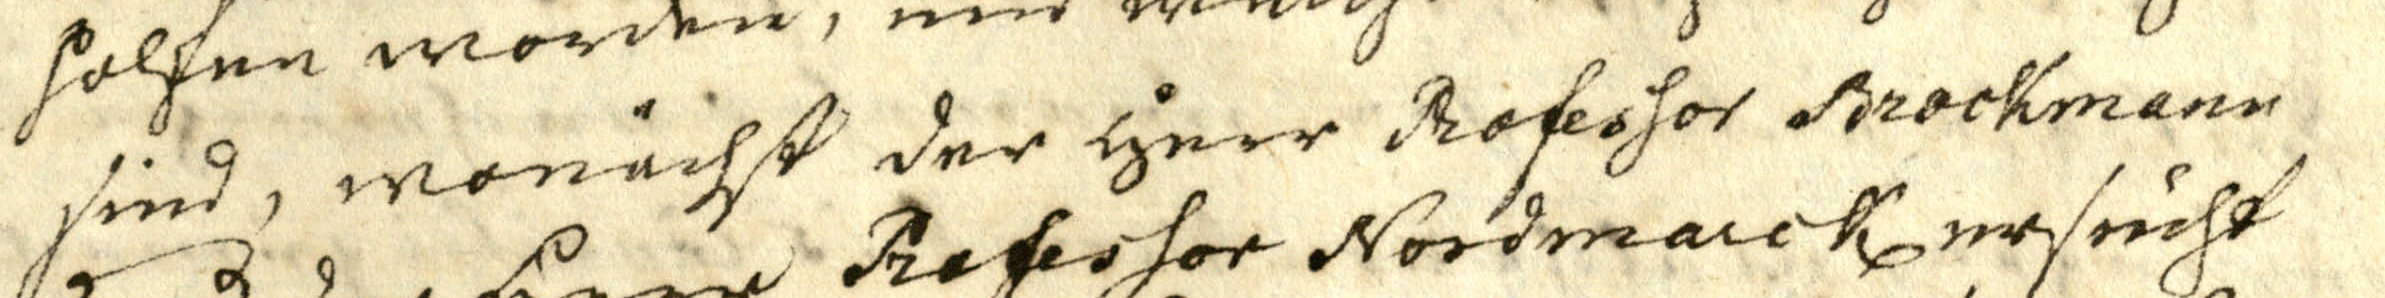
sind, wonächst der Herr Professor Brockmann
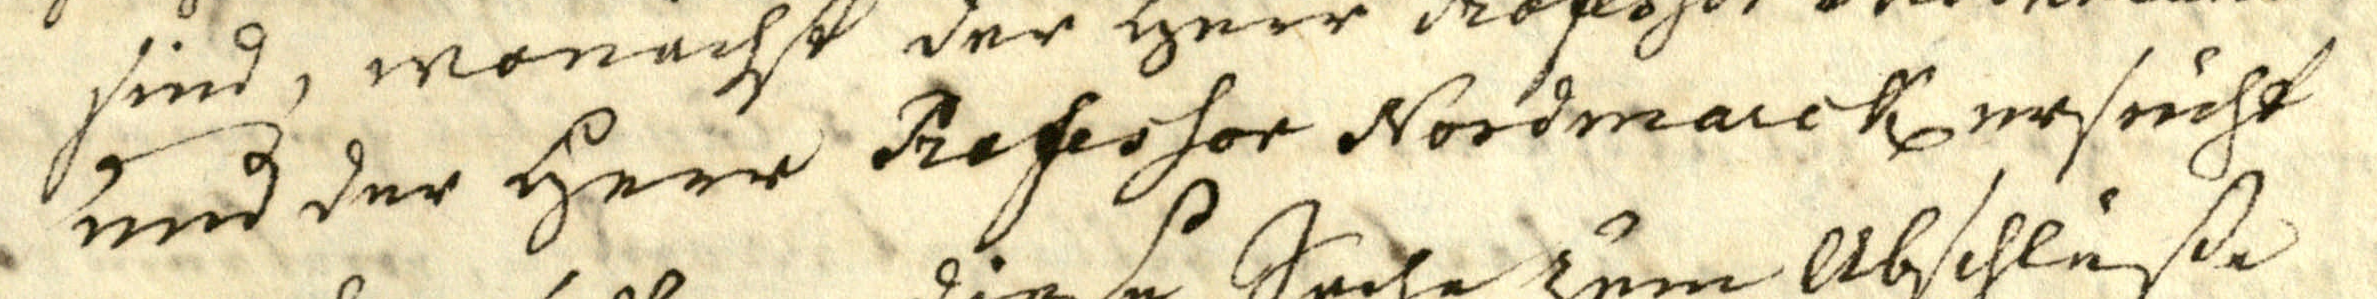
und der Herr Professor Nordmarck ersucht
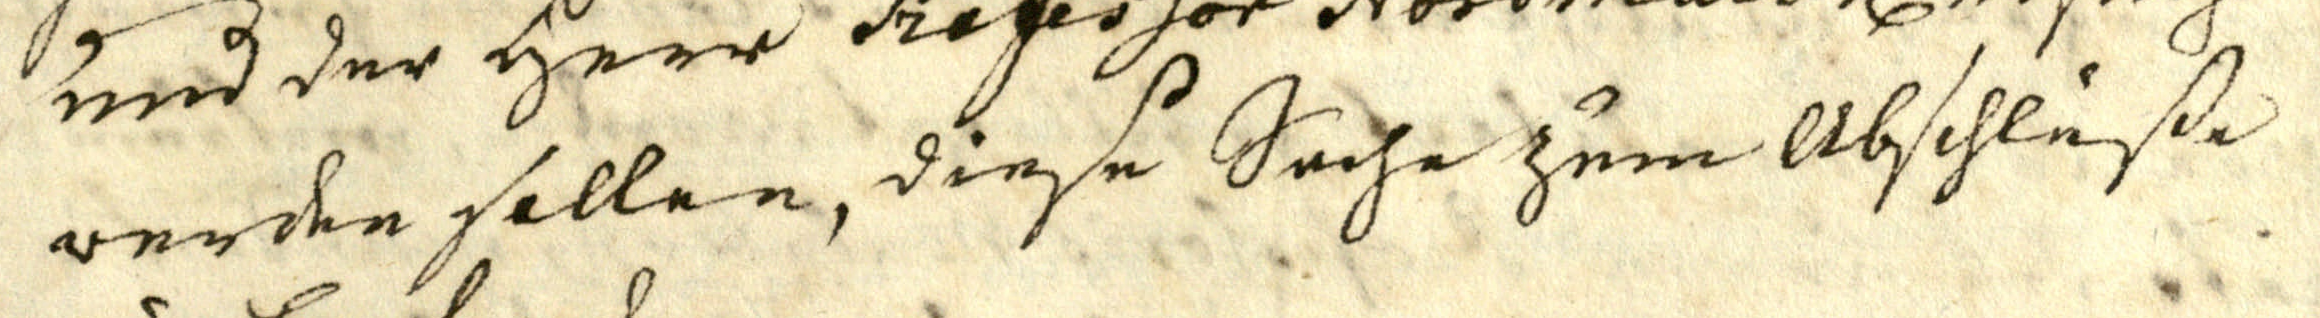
werden sollen, diese Sache zum Abschluße
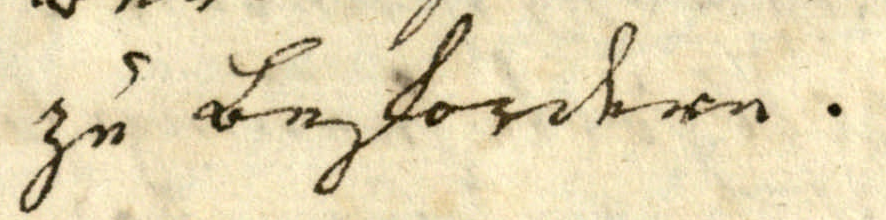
zu befordern.
